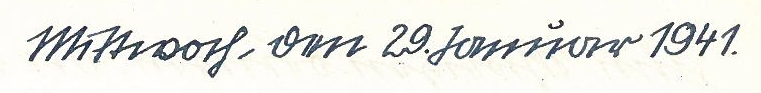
Mittwoch, den 29. Januar 1941.
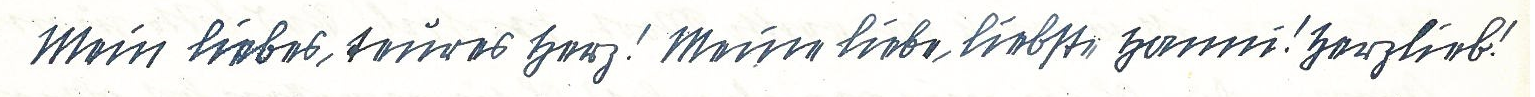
Mein liebes teures Herz! Meine liebe, liebste ! Herzlieb!
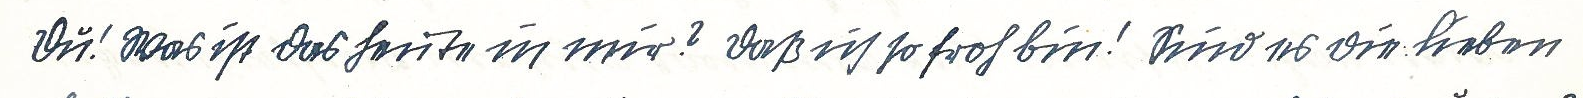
Du! Was ist das heute in mir? Daß ich so froh bin! Sind es die lieben
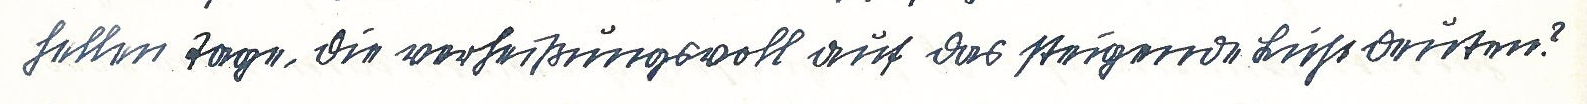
hellen Tage, die verheißungsvoll auf das steigende Licht deuten?
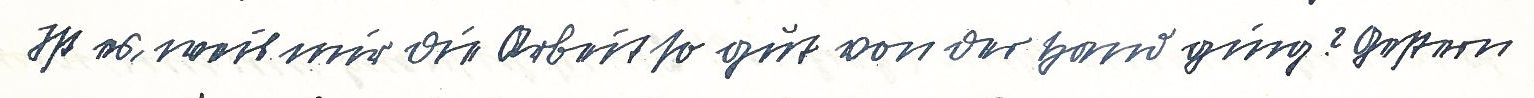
Ist es, weil mir die Arbeit so gut von der Hand ging? Gestern
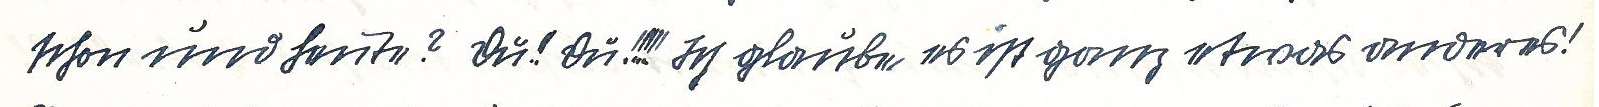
schon und heute? Du!! Du!!!!! Ich glaube, es ist etwas ganz anderes!
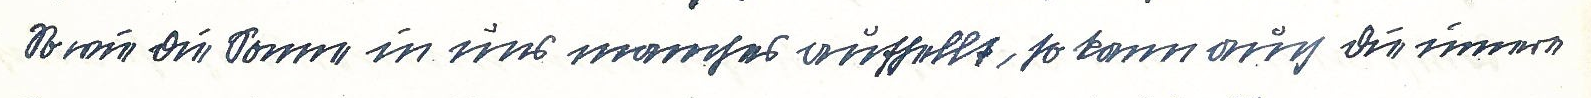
So wie die Sonne in uns manches aufhellt, so kann auch die innere
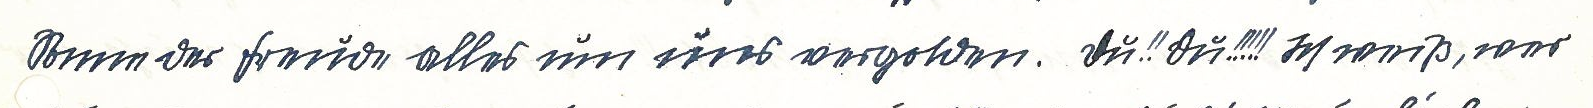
Sonne der Freude alles nun uns vergolden. Du!! Du!!!!! Ich weiß, wer
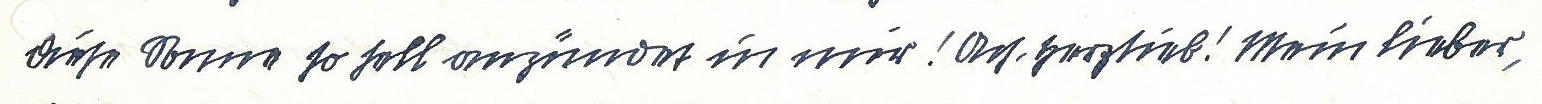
diese Sonne so hell anzündet in mir! Ach, Herzlieb! Mein lieber,
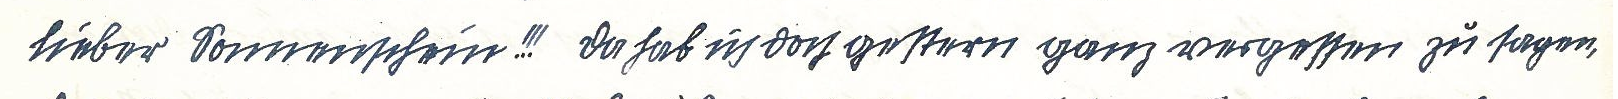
lieber Sonnenschein!!! Da hab ich doch gestern ganz vergessen zu sagen,
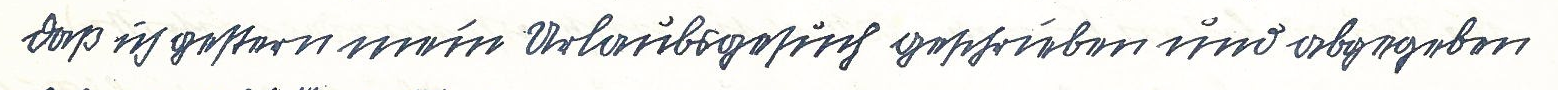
daß ich gestern mein Urlaubsgesuch geschrieben und abgegeben
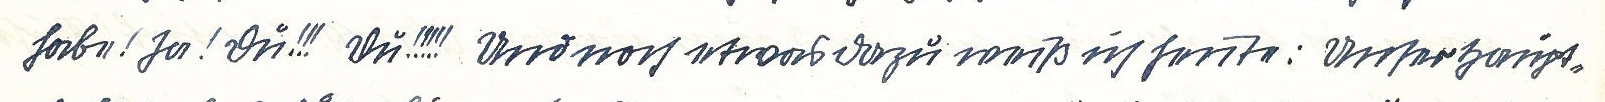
habe! Ja! Du!!! Du!!!!! Und noch etwas dazu weiß ich heute: Unser Haupt¬
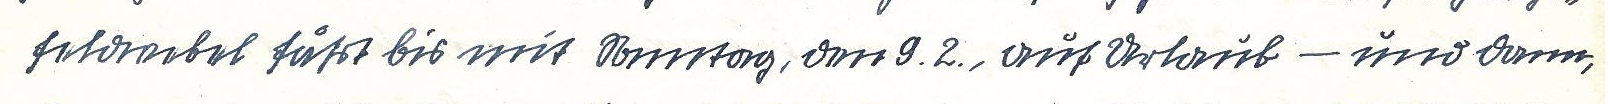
feldwebel fährt bis Sonntag, den 9.2., auf Urlaub – und dann,
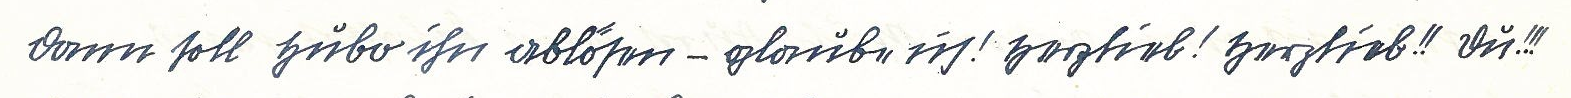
dann soll Hubo ihn ablösen – glaube ich! Herzlieb! Herzlieb!! Du!!!
